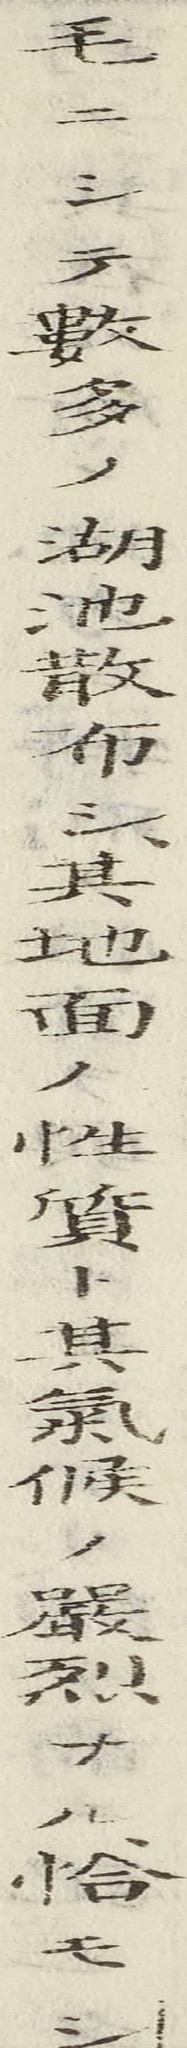毛ニシテ数多ノ湖池散布シ、其地面ノ性質ト其気候ノ厳烈ナル、恰モシ
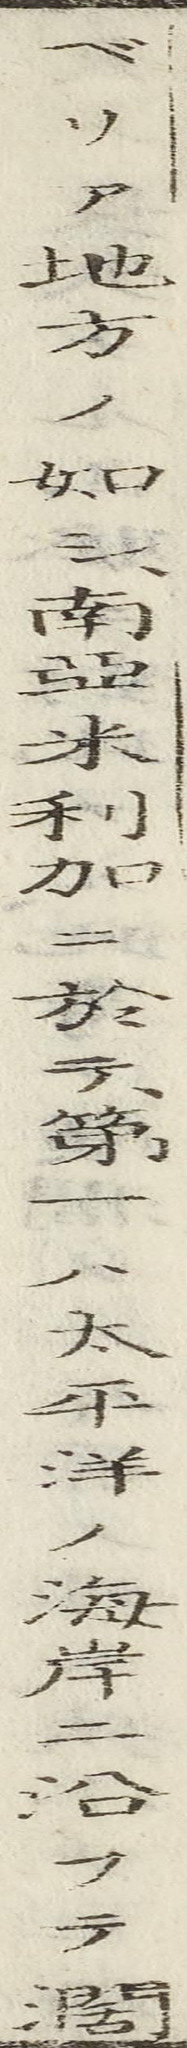ベリア地方ノ如シ、南亜米利加ニ於テ、第一ハ太平洋ノ海岸ニ沿フテ濶
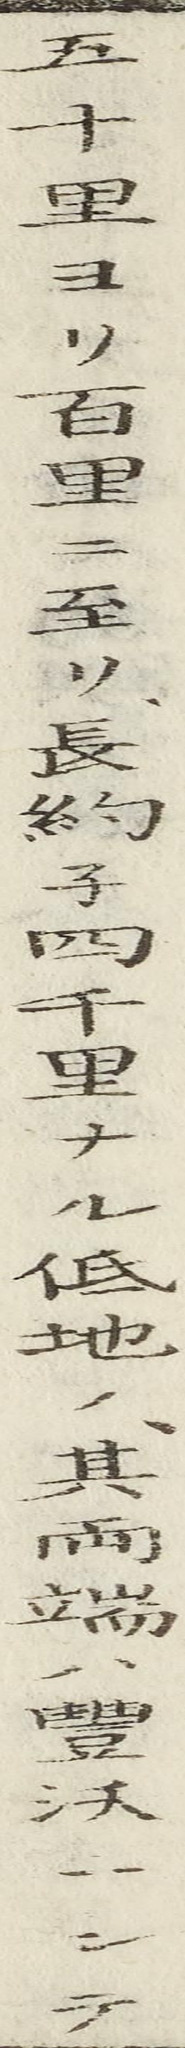五十里ヨリ百里ニ至リ、長約ネ四千里ナル低地ノ、其両端ハ豊沃ニシテ
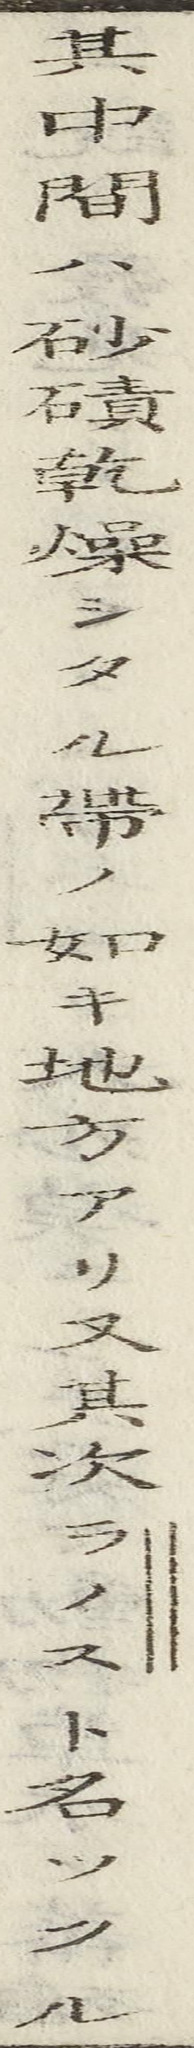其中間ハ砂磧乾燥シタル帯ノ如キ地方アリ又其次ラノスト名ツクル
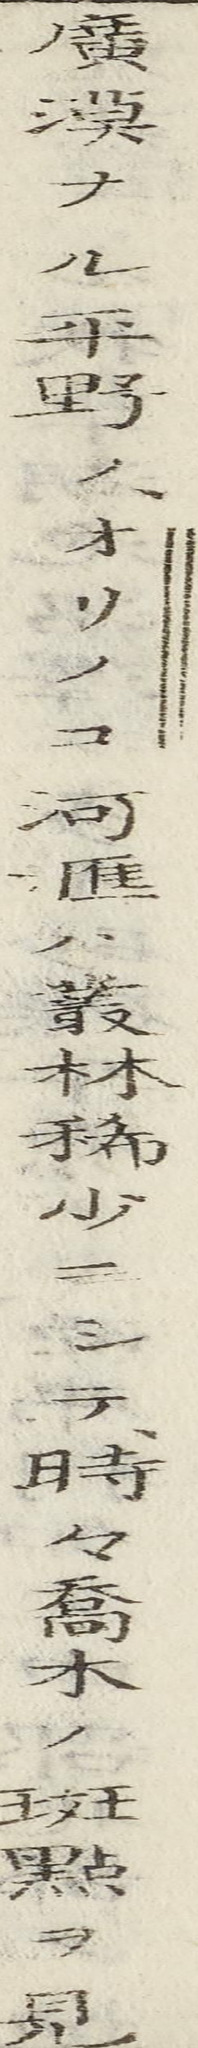広漠ナル平野ノ、オリノコ河匯ハ叢林稀少ニシテ、時々喬木ノ斑点ヲ見
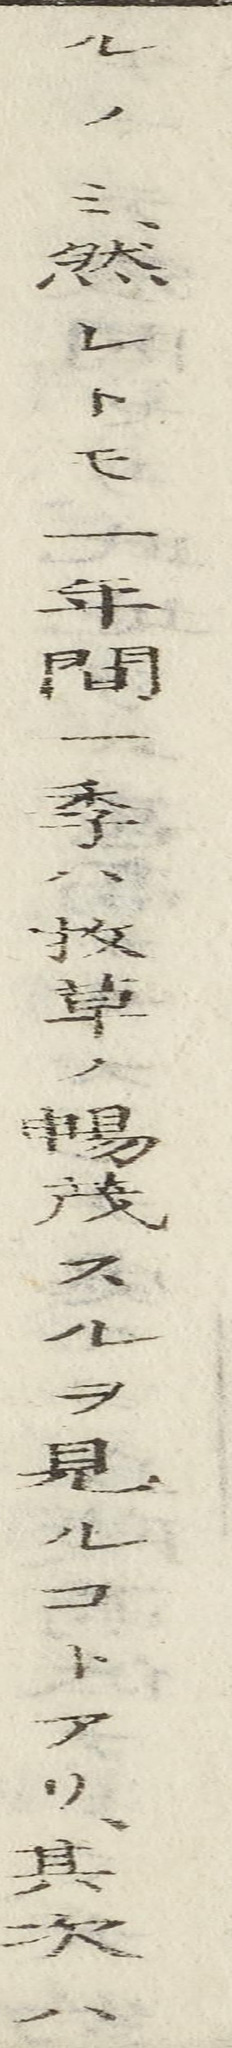ルノミ、然レトモ一年間一季ハ牧草ノ暢茂スルヲ見ルコトアリ、其次ハ
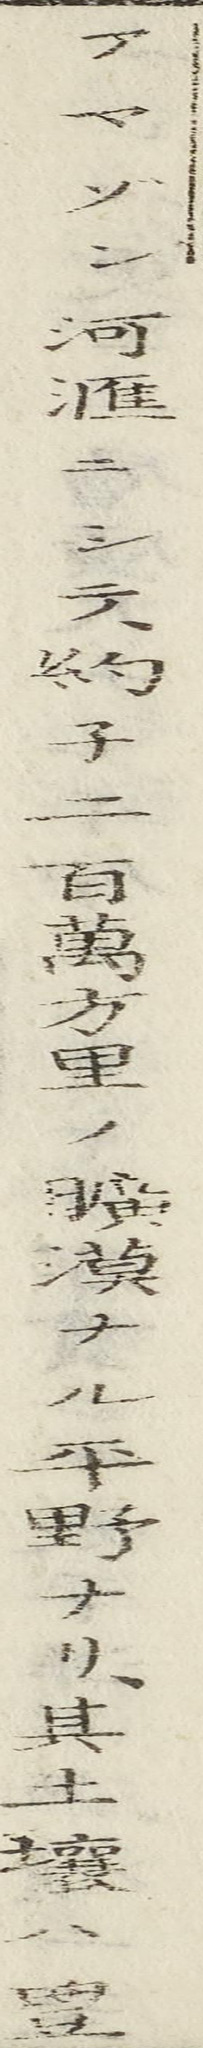アマゾン河匯ニシテ、約ネ二百万方里ノ曠漠ナル平野ナリ、其土壌ハ豊
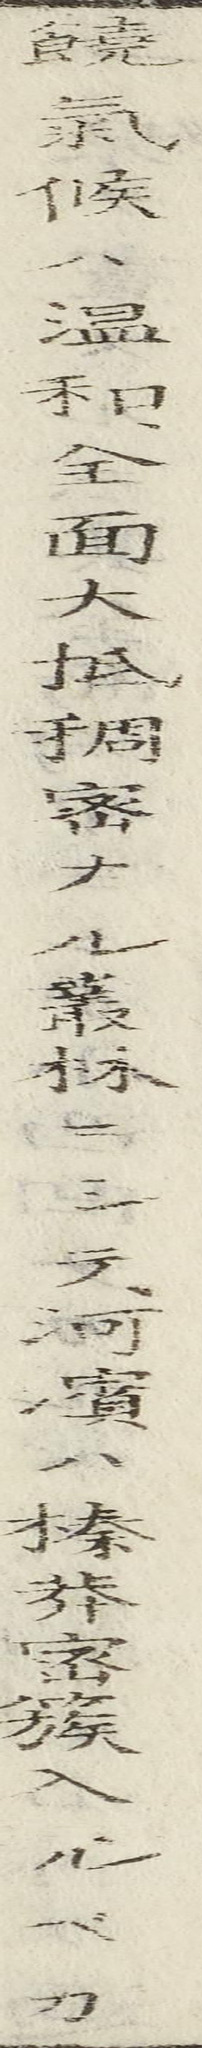饒気候ハ温和、全面大抵稠密ナル叢林ニシテ、河浜ハ榛芥密簇入ルベカ
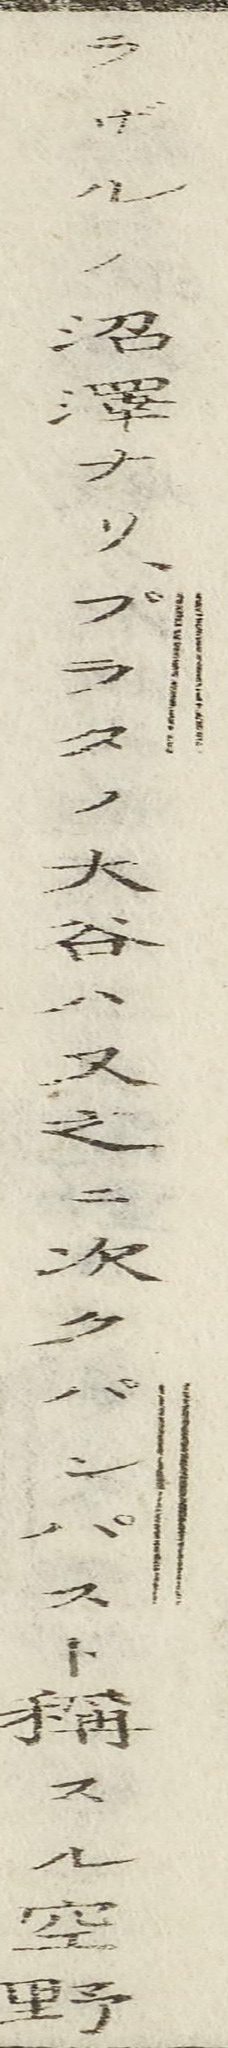ラザルノ沼沢ナリ、プラクノ大谷ハ又之ニ次クパンパスト称スル空野
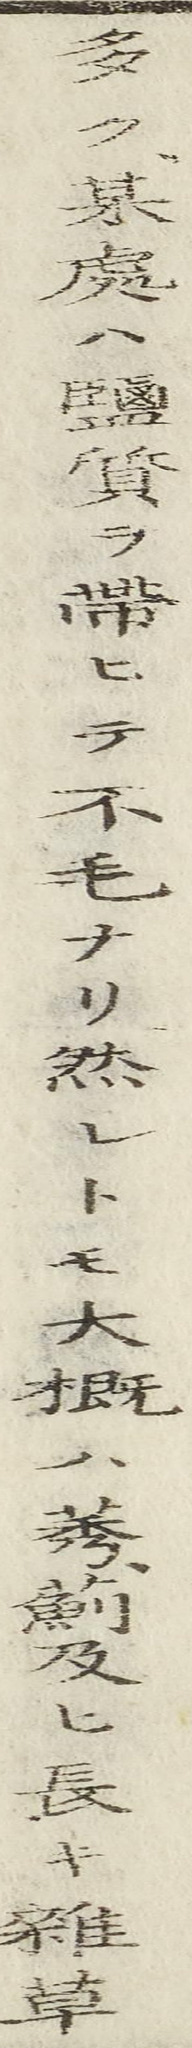多ク、某処ハ塩質ヲ帯ヒテ不毛ナリ然レトモ大概ハ莠、薊及ヒ長キ雑草
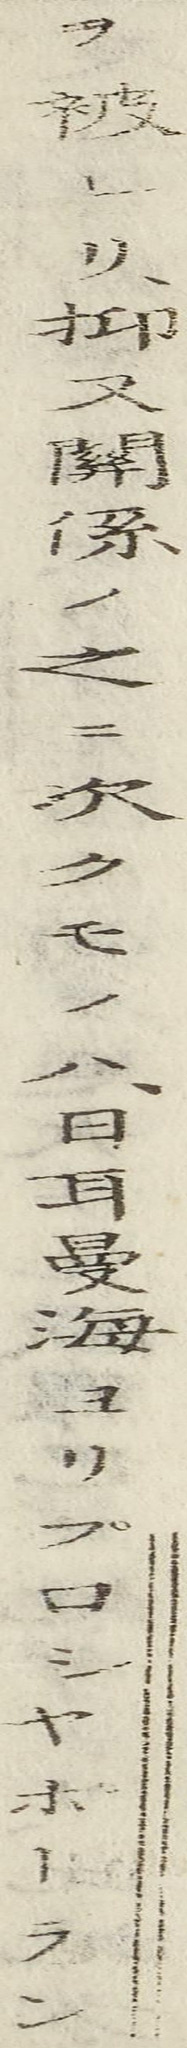ヲ被レリ、抑又関係ノ之ニ次クモノハ、日耳曼海ヨリプロシヤポーラン

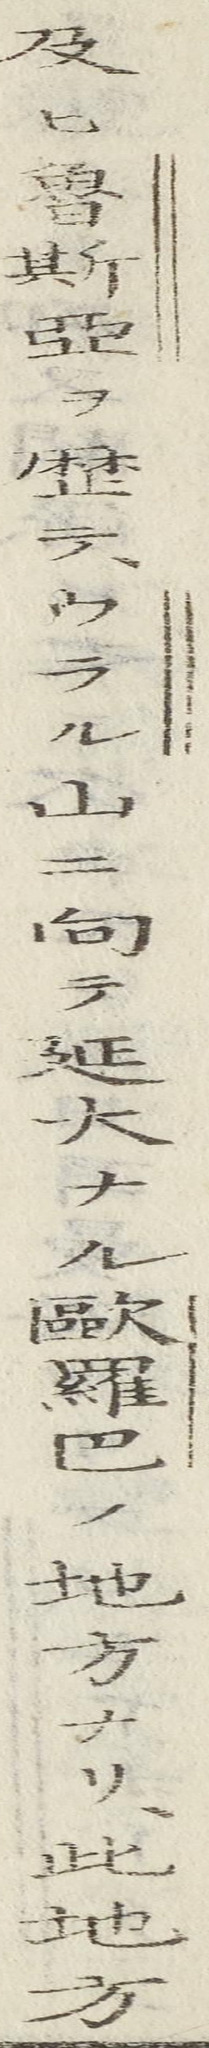及ヒ魯斯亜ヲ歴テ、ウラル山ニ向テ延大ナル欧羅巴ノ地方ナリ、此地方
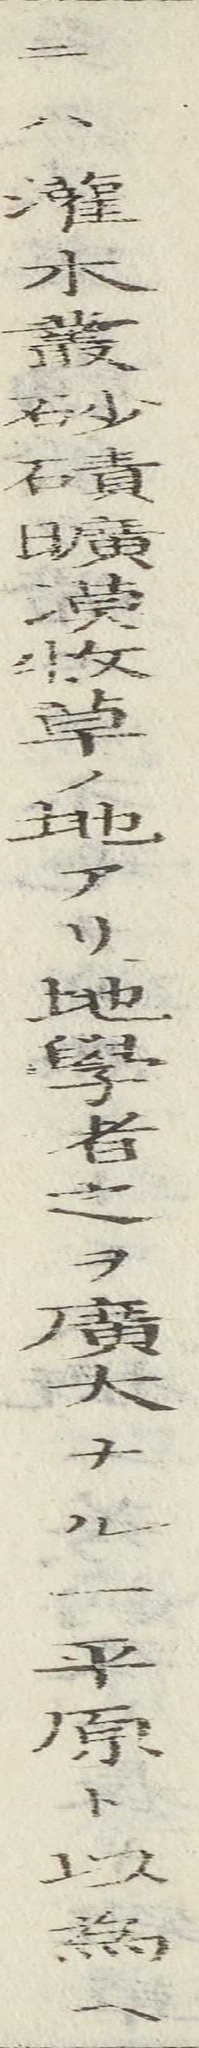ニハ灌木叢砂磧曠漠牧草ノ地アリ、地学者之ヲ広大ナル一平原ト以為ヘ
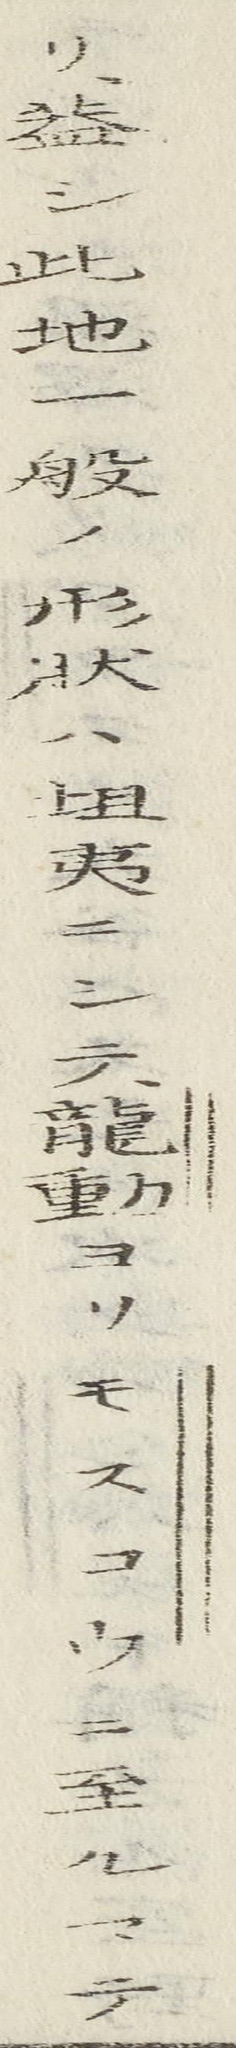リ、蓋シ此地一般ノ形状ハ坦夷ニシテ、龍動ヨリモスコウニ至ルマテ
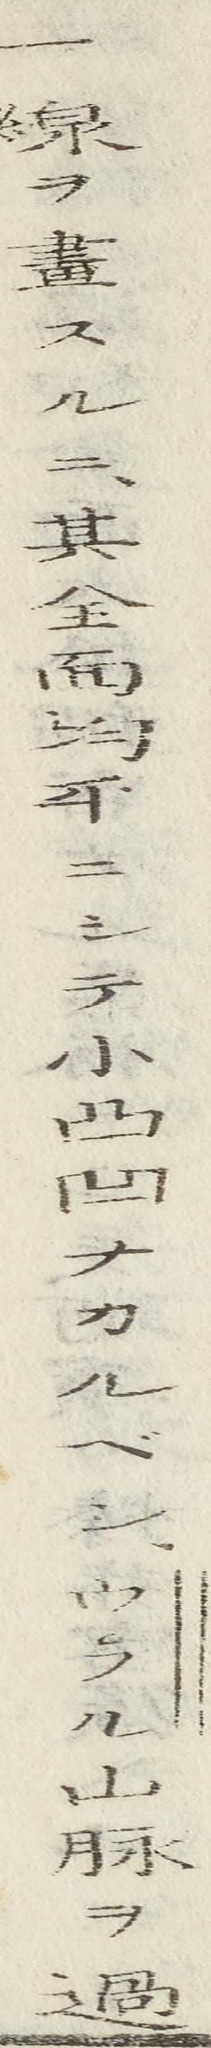一線ヲ画スルニ、其全面均平ニシテ小凸凹ナカルベシ、ウラル山脉ヲ過
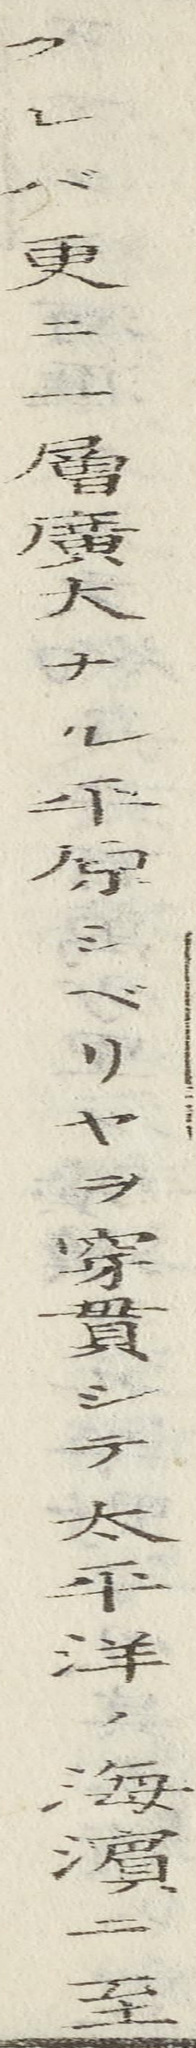クレバ更ニ一層広大ナル平原シベリヤヲ穿貫シテ太平洋ノ海浜ニ至
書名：百科全書　地文學　全
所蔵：東京大学地震研究所図書室 Earthquake Research Institute Library, The University of Tokyo, JAPAN
